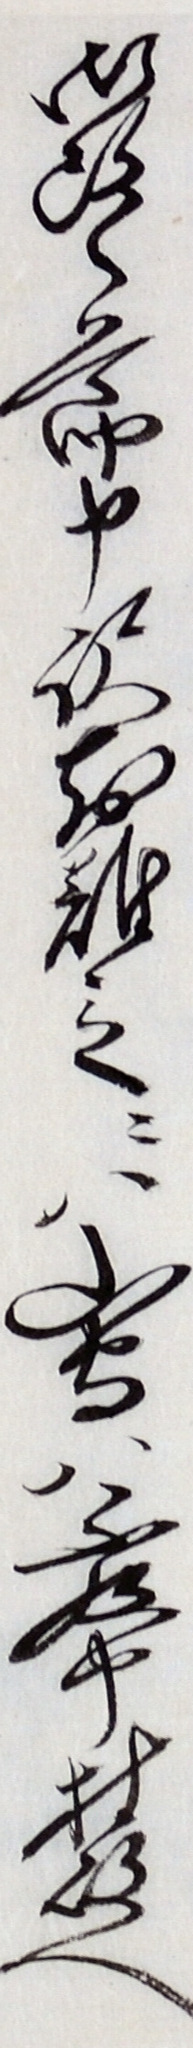御改之節申訳於難立ニハ山守ハ不及申村役人
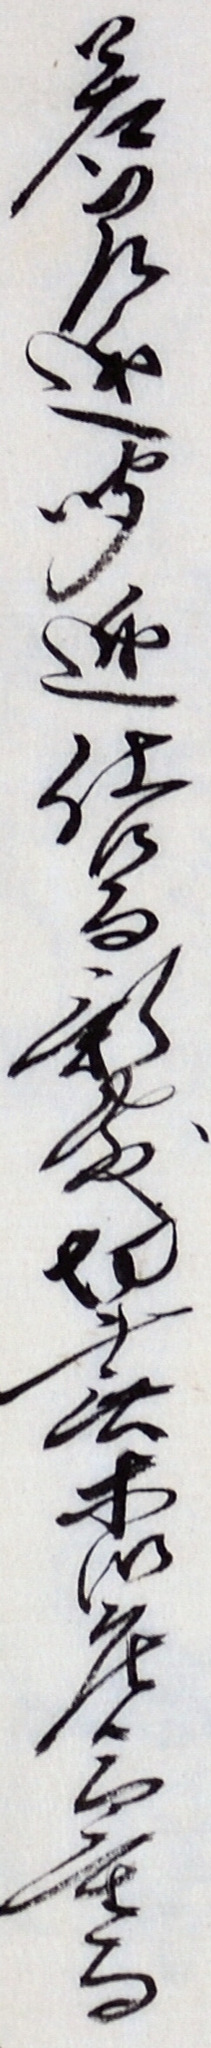若見逃聞逃仕候而新敷切蕪等御座候而重而
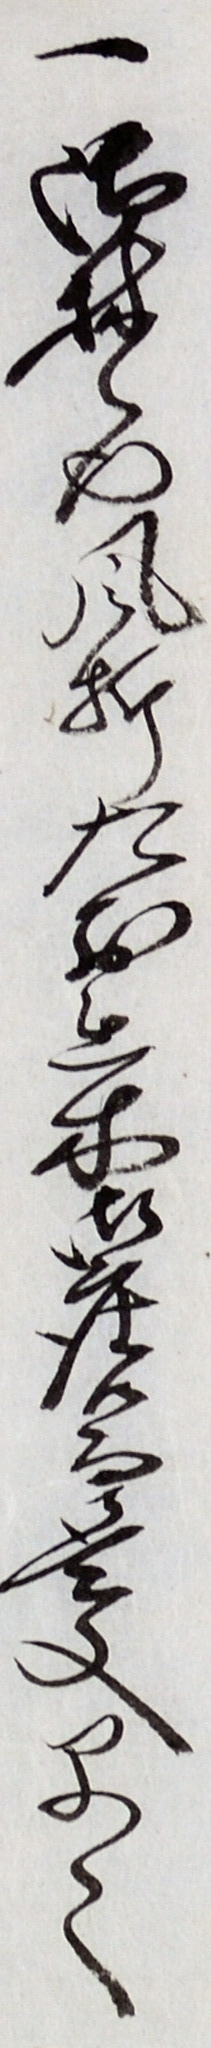一御林之内風折たおれ木御座候而是又早々
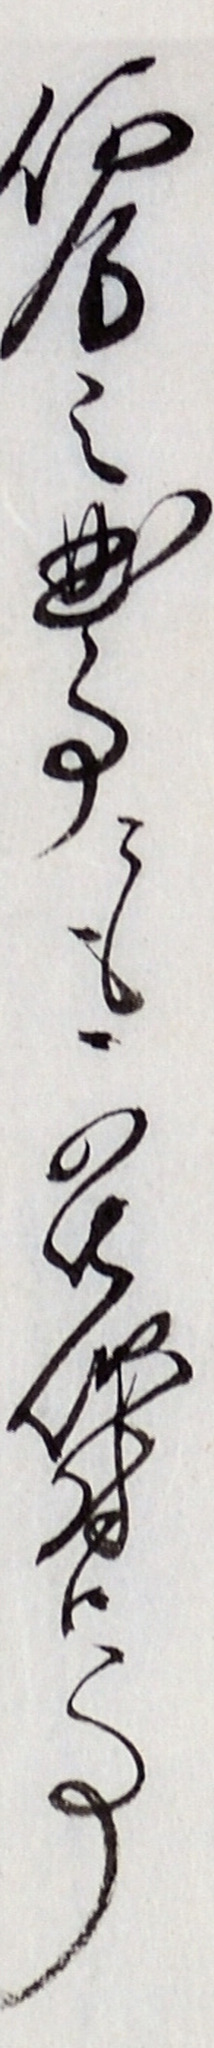何分之曲事ニも可被仰付候事
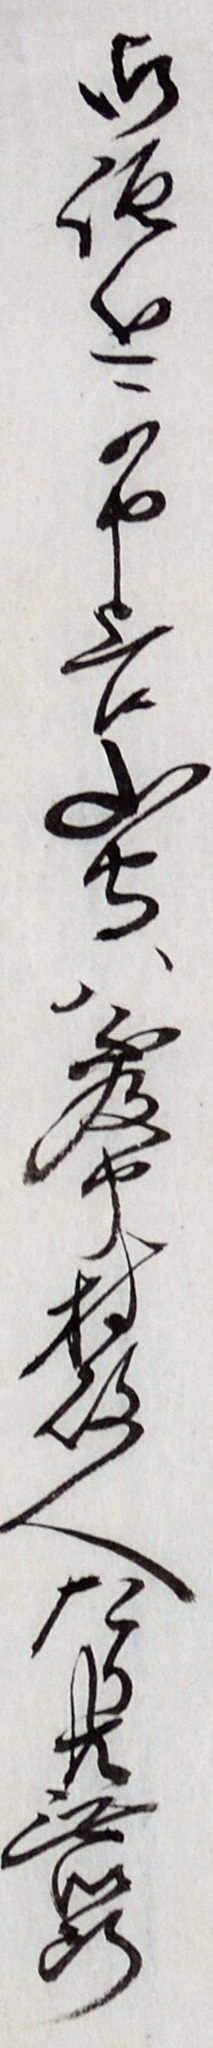御注進可申上候山守ハ不及申村役人たり共無御断
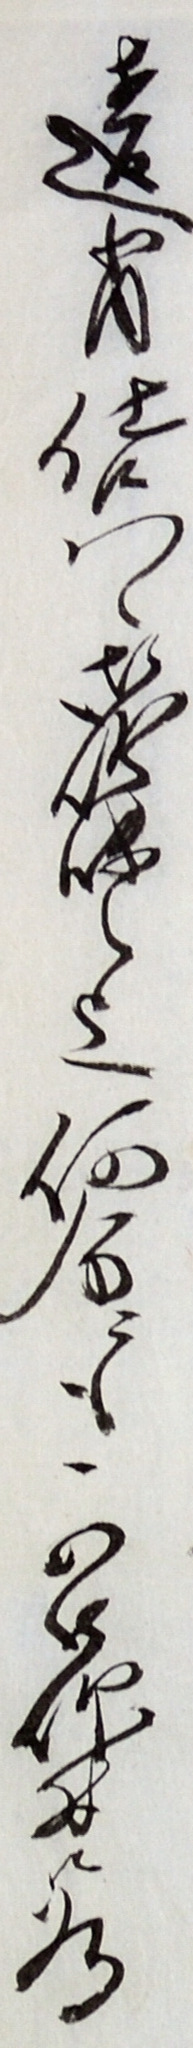違背仕候ハヽ御吟味之上何分ニも可被仰付候為
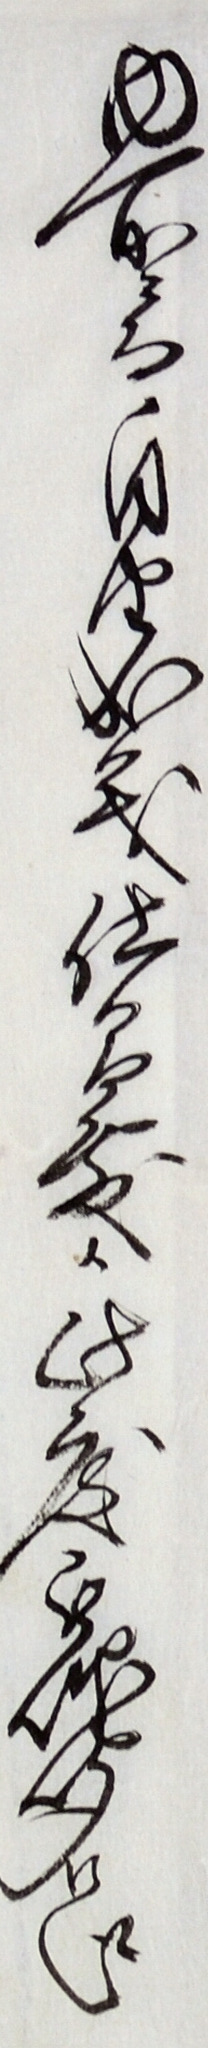内所ニ而自由成義仕間敷候此度被仰聞候趣

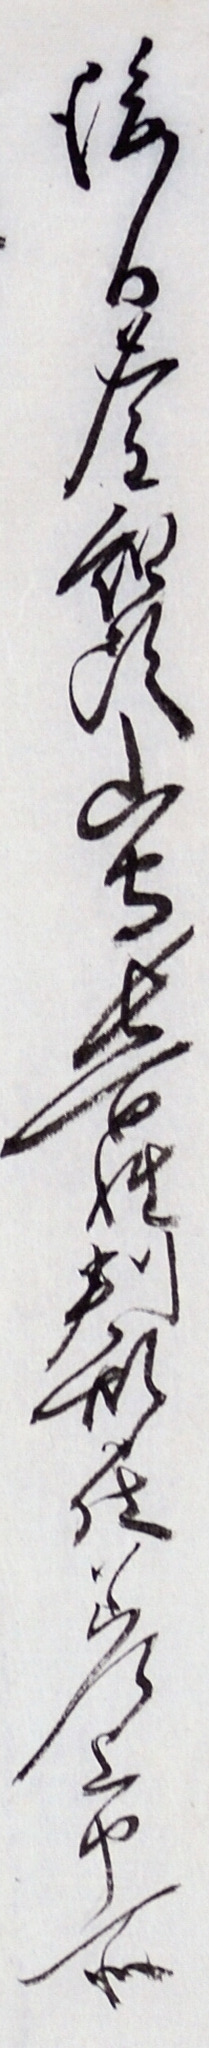後日名主組頭山守長百姓判形仕差上申所
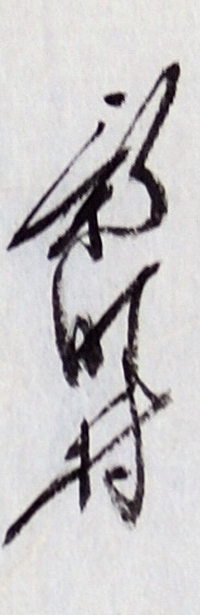新町村
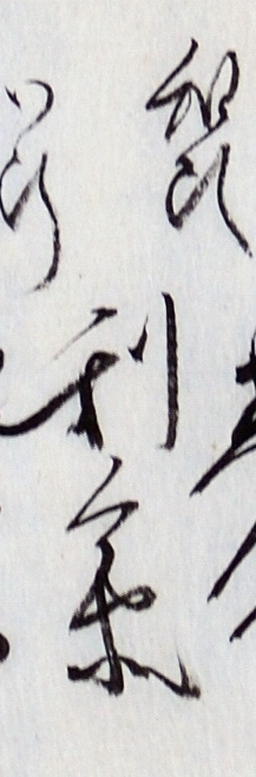組頭利兵衛
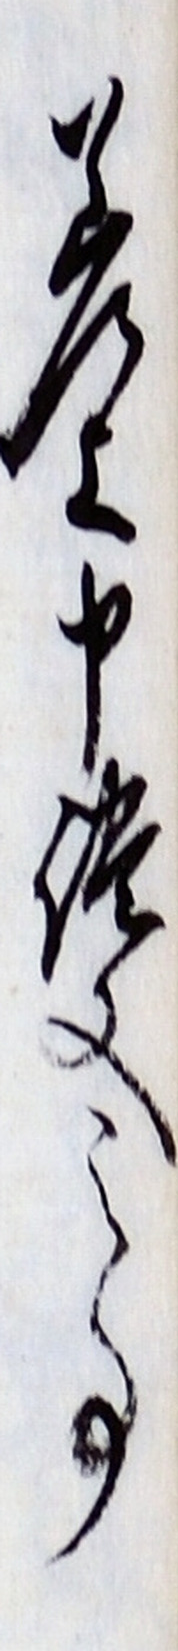差上申証文之事
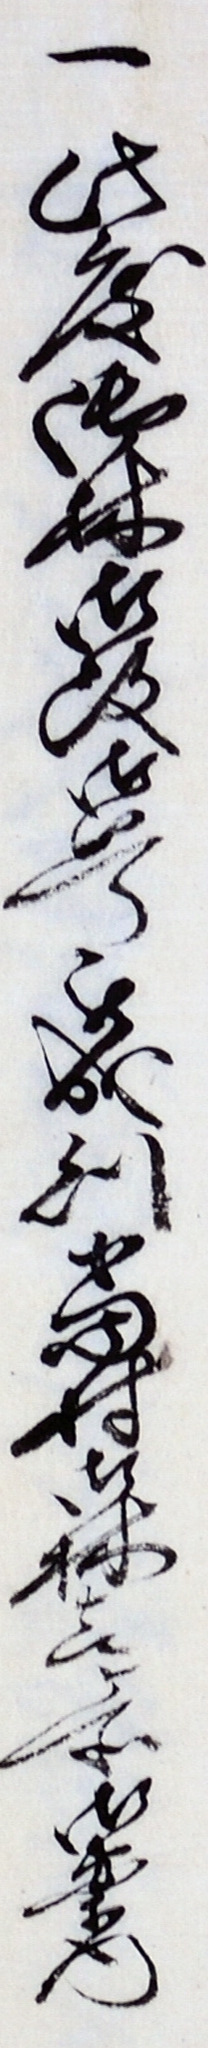一此度御林御改御廻り被成則当村御林壱ヶ所御案内
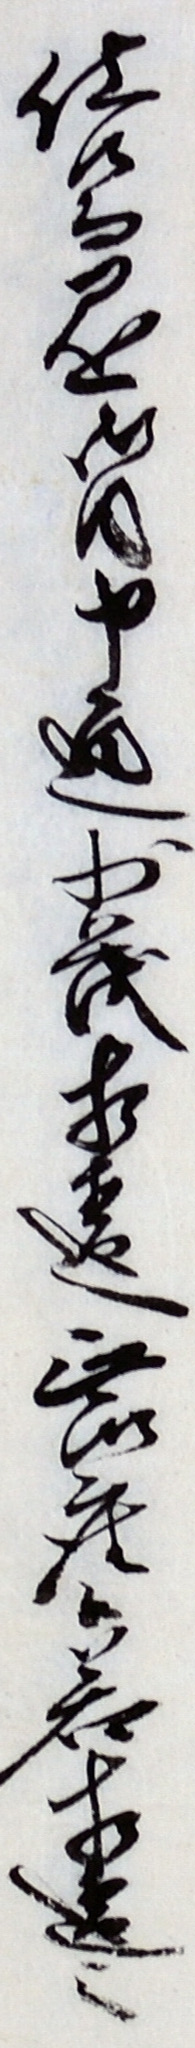仕候而懸御目申通少も相違無御座候若相違之
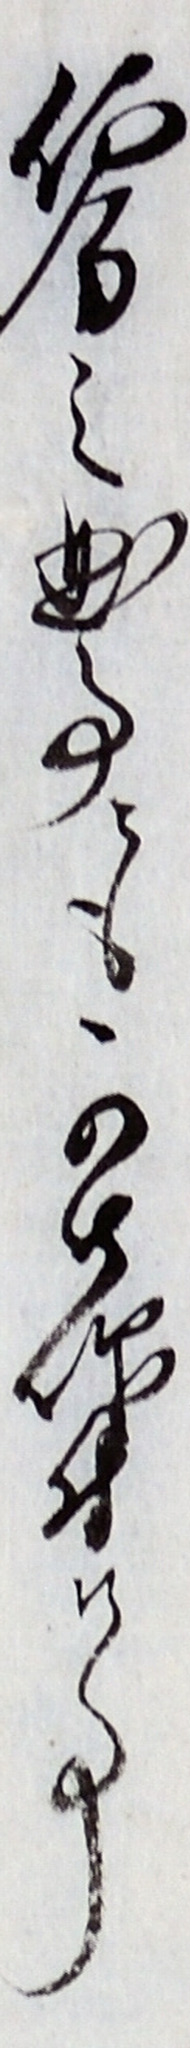何分之曲事ニも可被仰付候事
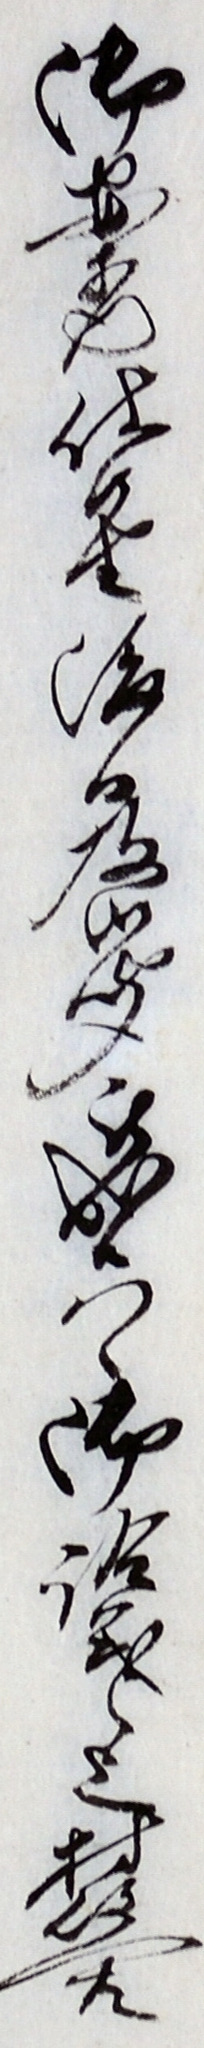御案内仕候由後日及御聞被成候ハヽ御詮義之上村役人共
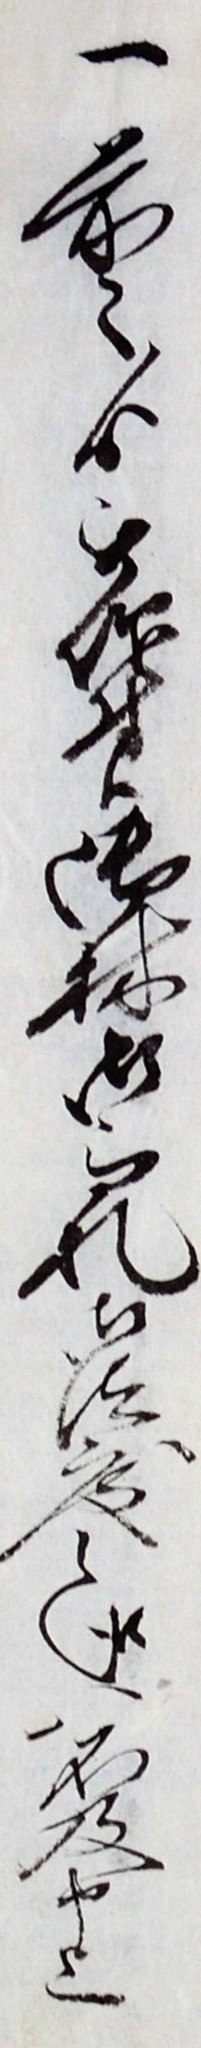一前々ゟ被仰付候御林御高札御法度之趣不及申上
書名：御林御竹藪証文控
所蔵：伊那市立高遠町図書館・合同会社AMANE
